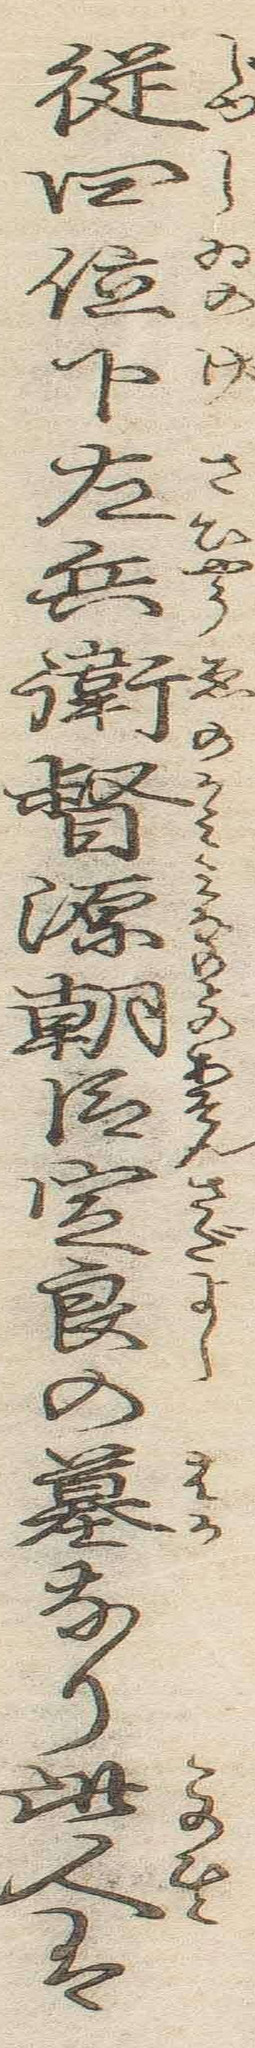従四位下左兵衞督源朝臣定良の墓なり此人は
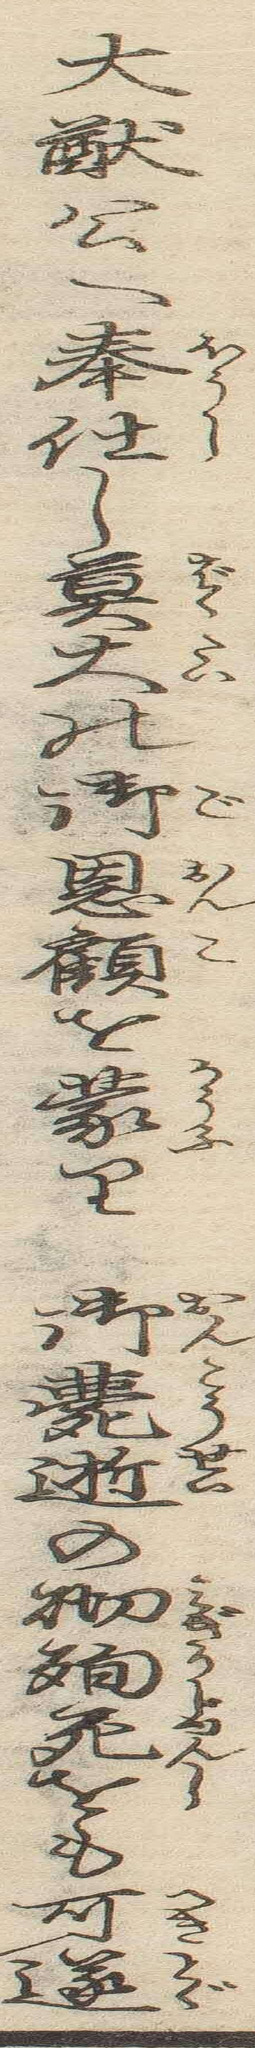大猷公へ奉仕し莫大の御恩顧を蒙り御薨逝の砌殉死をも可遂

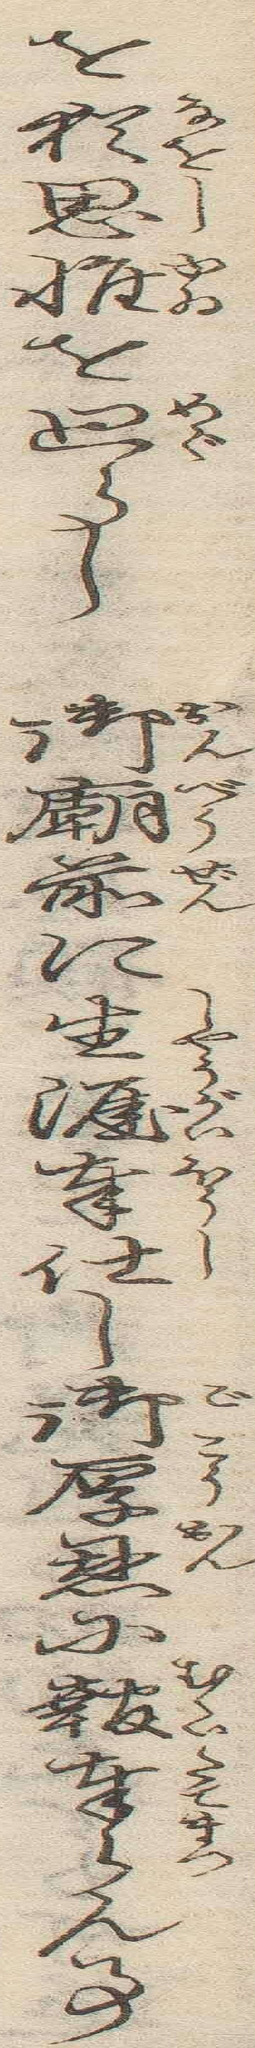を猶思惟を廻らし御廟前に生涯奉仕し御厚恩に報奉らん事
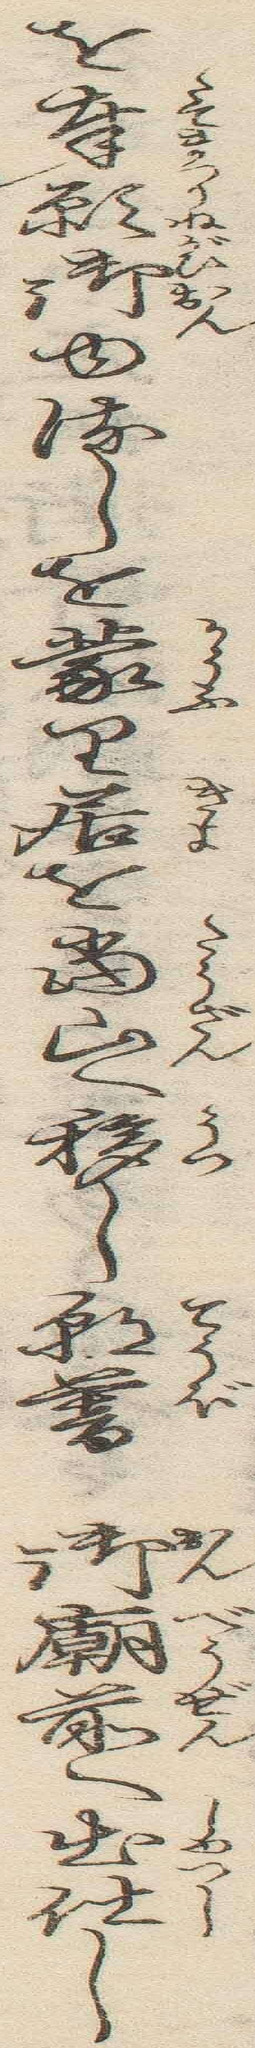を奉願御ゆるしを蒙り居を當山へ移し朝暮御廟前へ出仕し
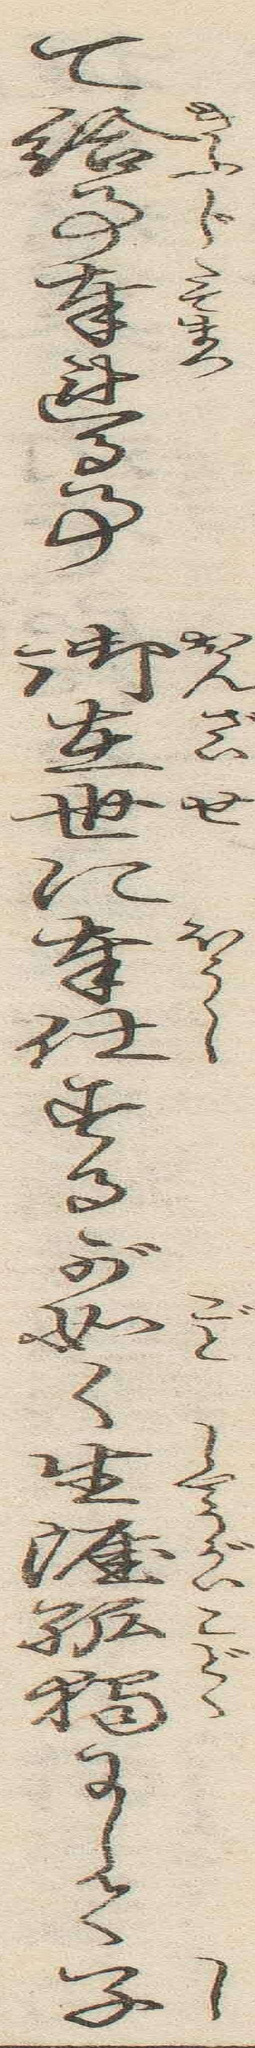て給事奉れる事御在世に奉仕するが如く生涯孤獨にして子
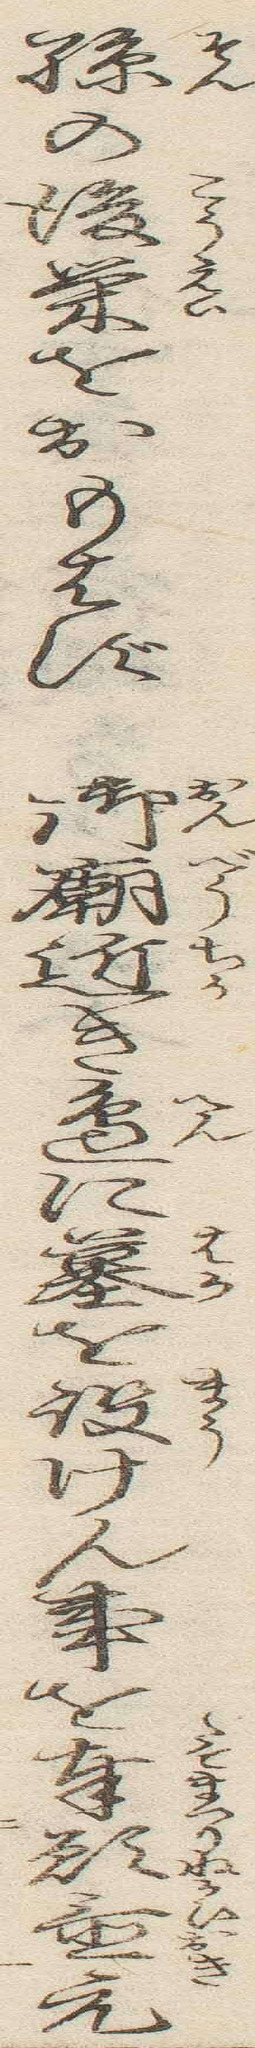孫の後栄をおもはず御廟近き邊に墓を設けん事を奉願置元
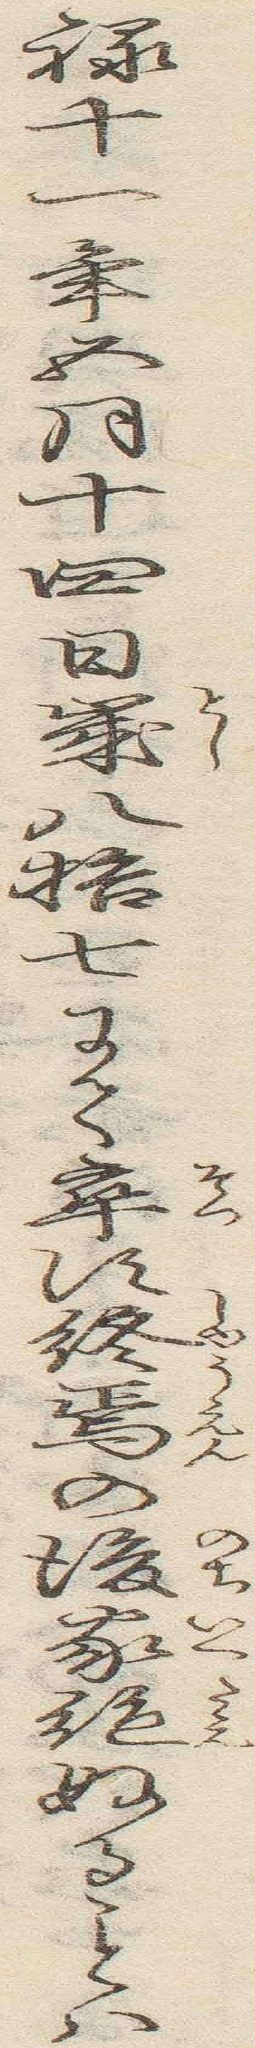禄十一年五月十四日歳八拾七にて卒す終焉の後家絶ぬることは
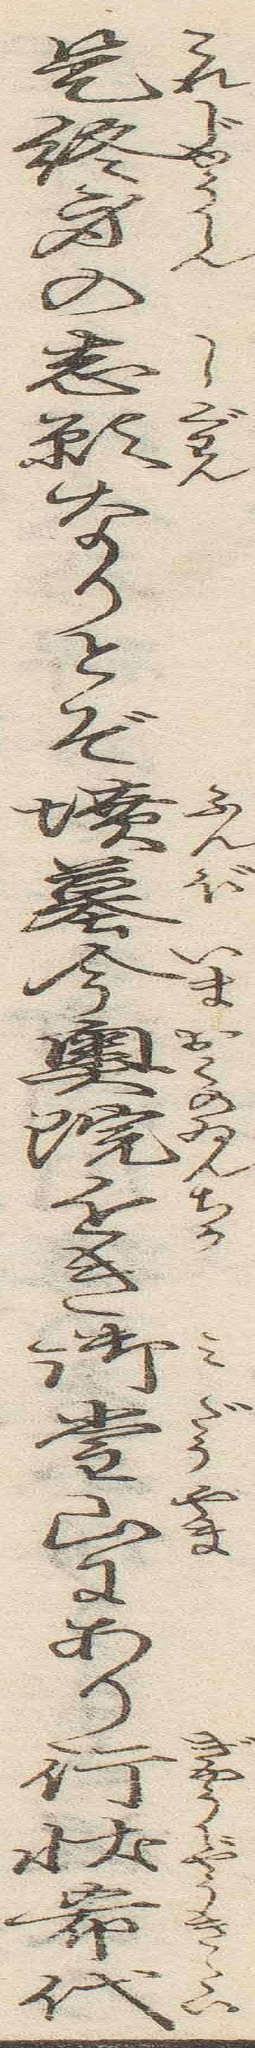是終身の志願なりとぞ墳墓今奥院近き御堂山にあり行状希代
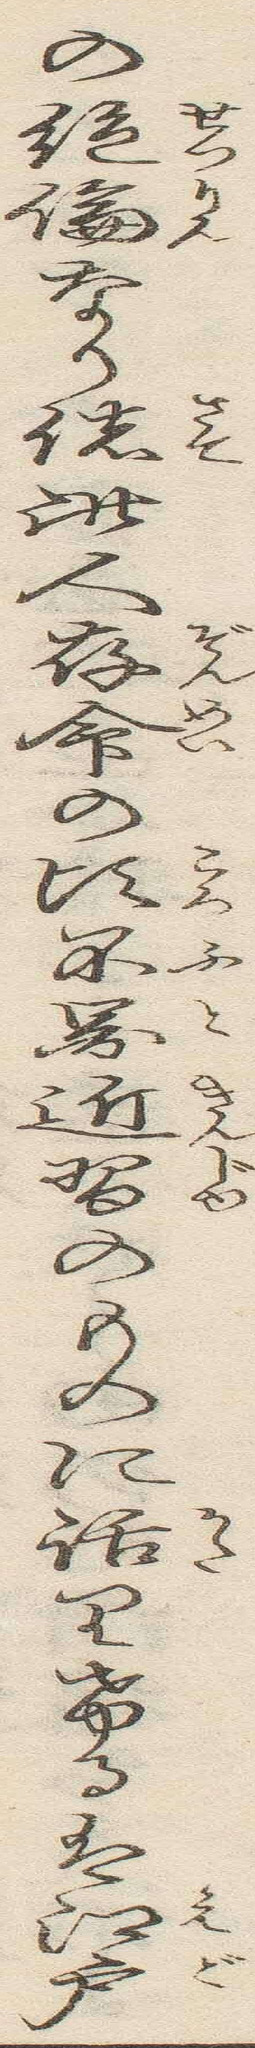の絶倫なり偖此人存命の頃不圖近習のものに話りけるは江戸
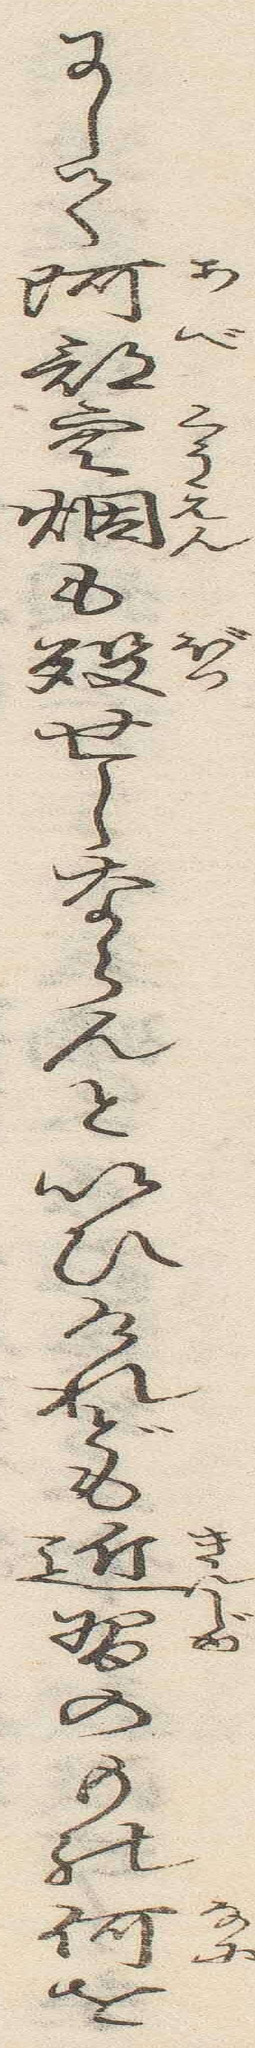にして阿部空烟も歿せしならんといひけれども近習のもの何を
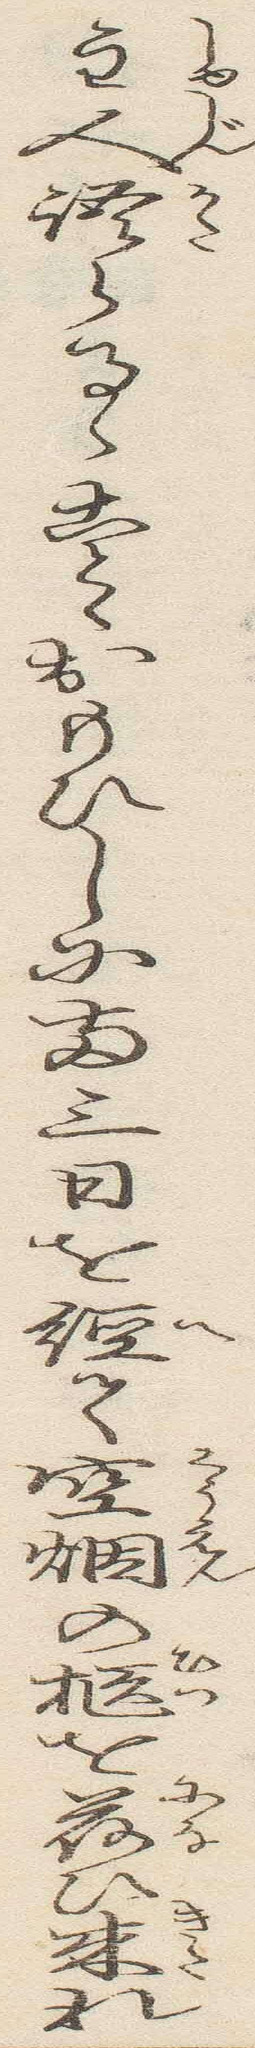主人語らるゝことゝおもひしに両三日を經て空烟の柩を荷ひ來れ
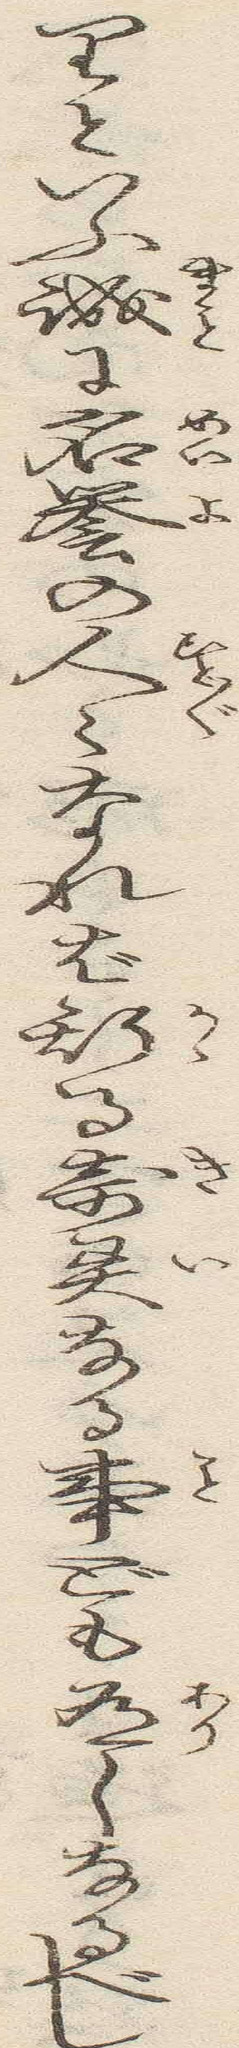りといふ誠に名誉の人〻なれば斯る奇異なる事ども有しなるべし
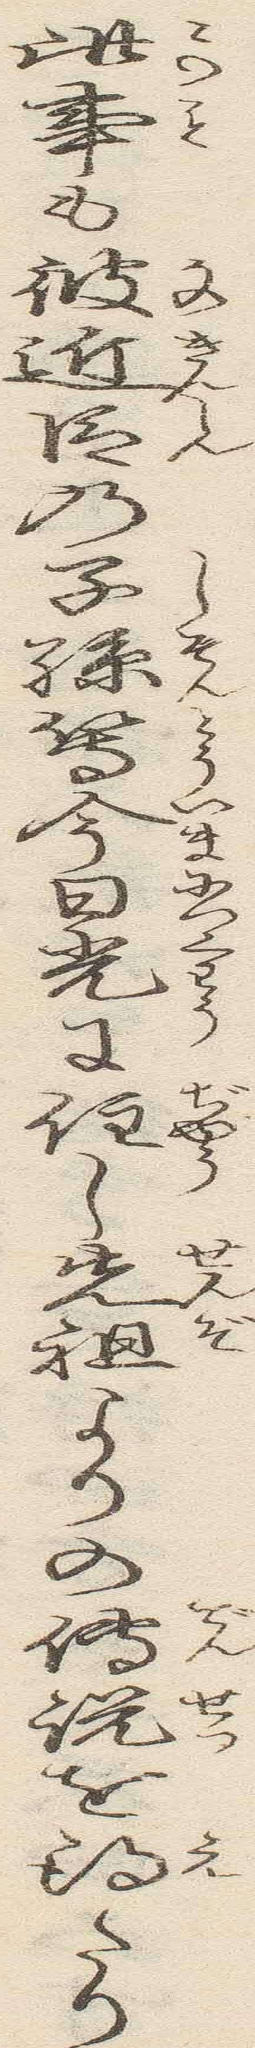此事も彼近臣の子孫等今日光に住し先祖よりの傳説を得たり
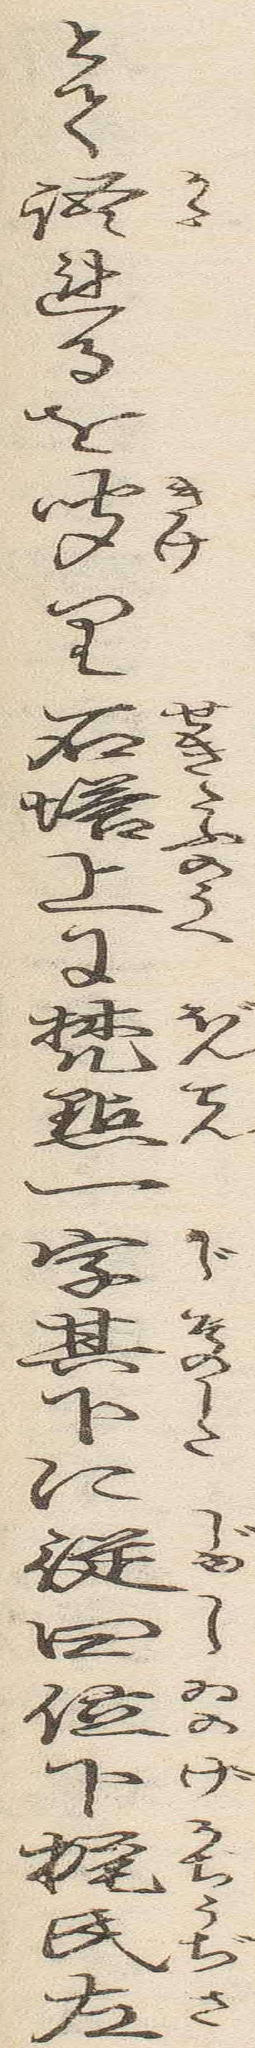とて語れるを聞り石塔上に梵點一字其下に従四位下梶氏左
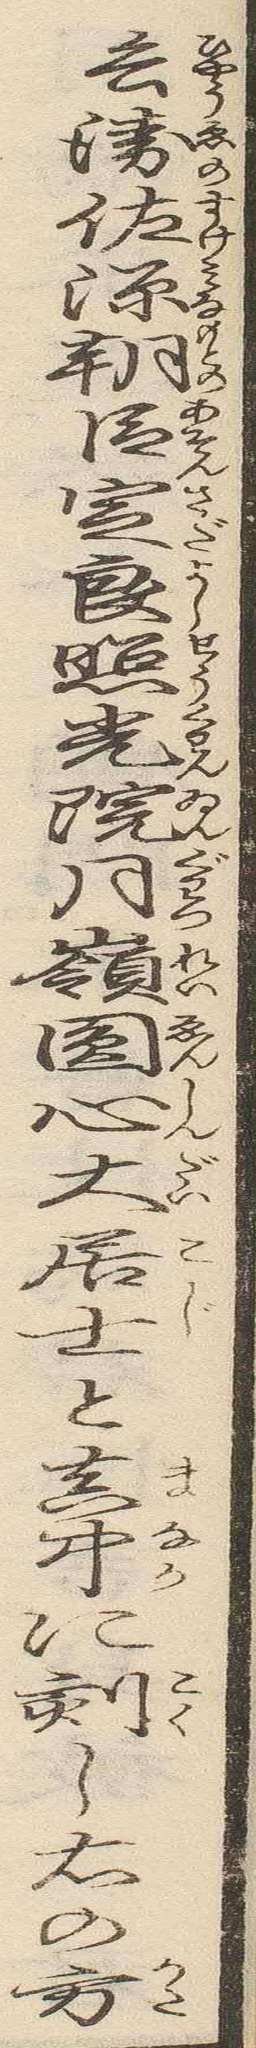兵衛佐源朝臣定良照光院月嶺圓心大居士と真中に𠜇し右の方
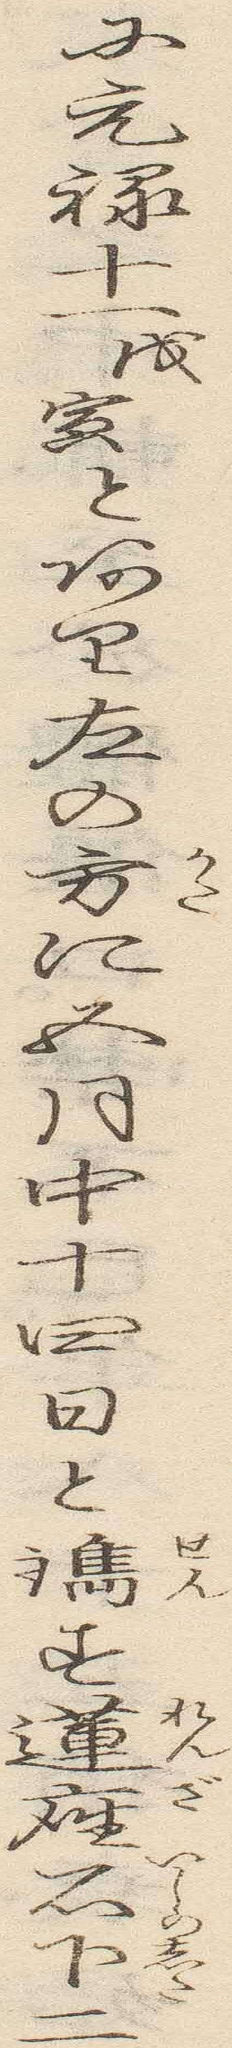に元禄十一戊寅とあり左の方に五月中十四日と鐫す蓮座石下二
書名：日光山志
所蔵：東京学芸大学附属図書館 国文学研究資料館
